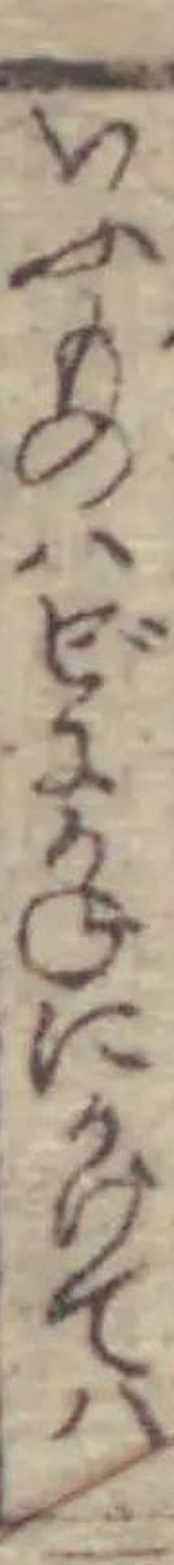いふものはぜにかねにかけては
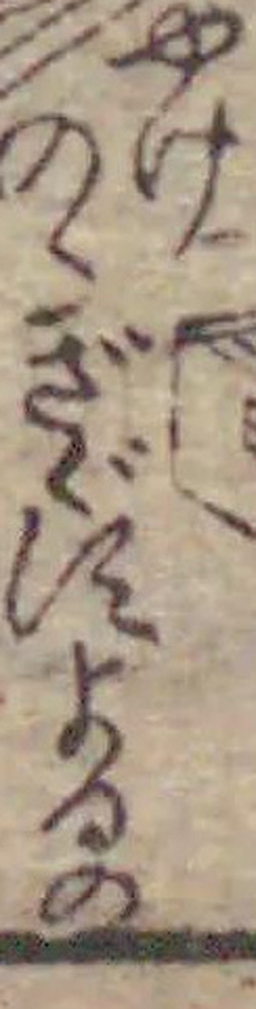のゝぎゞすよるの
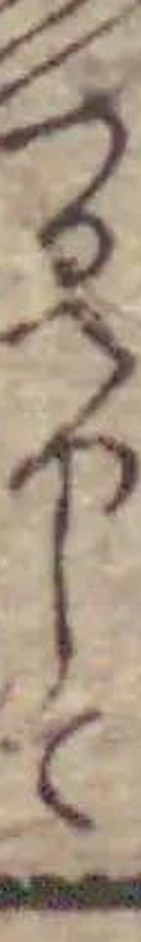つるへつして
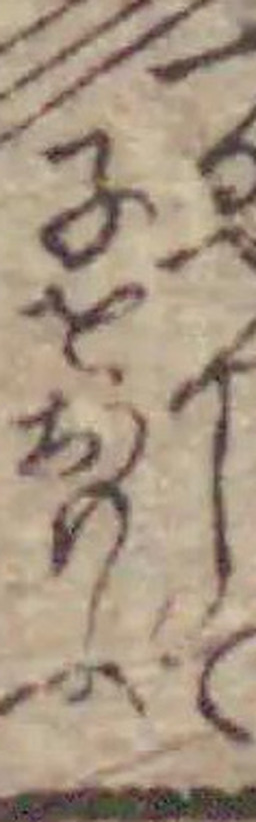子をおもふ
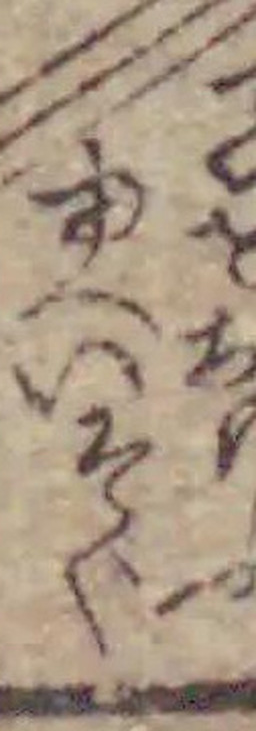ゆへいそぐ
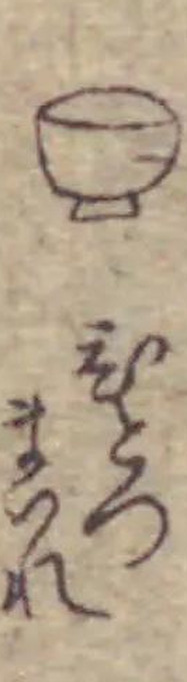ひとつ
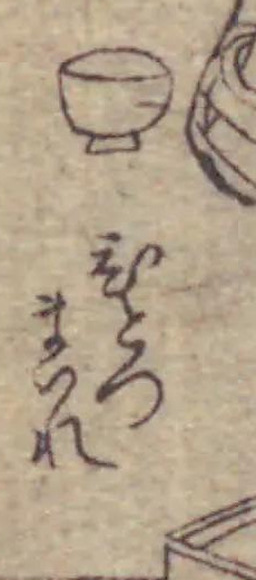ひとつ
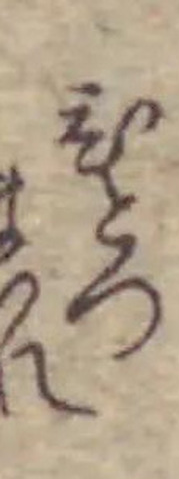ひとつ
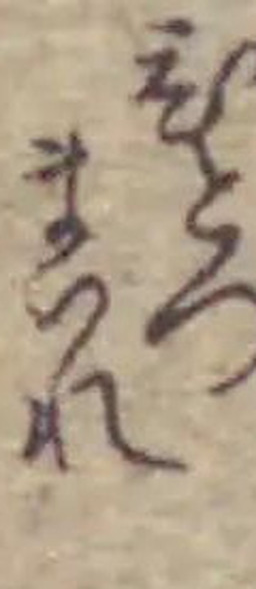まいれ
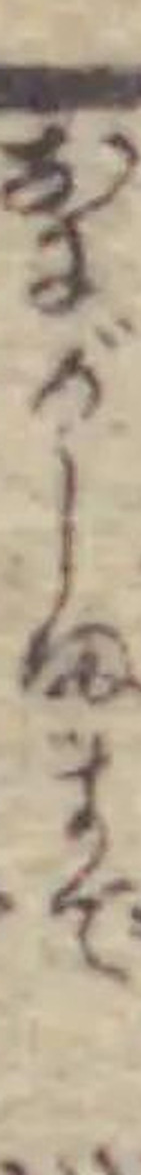おにがしままで
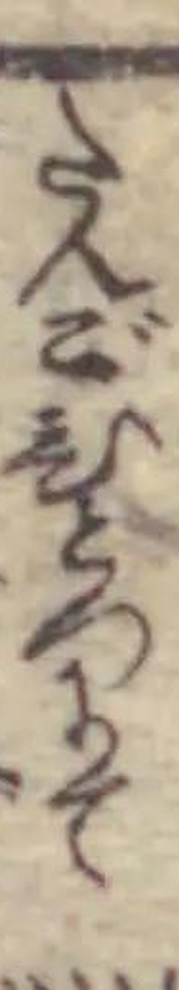たんごひとつにて
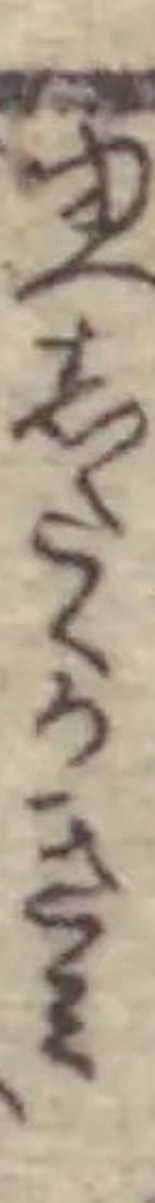ゆへしたゝかきみ
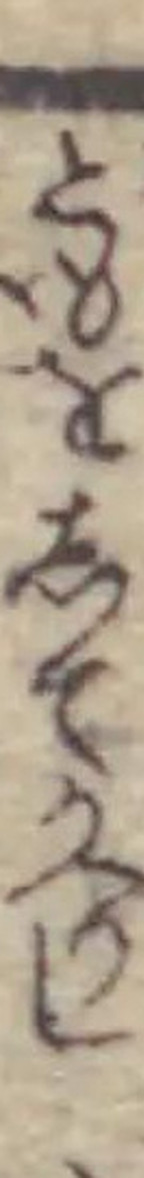ともをしてかへりし
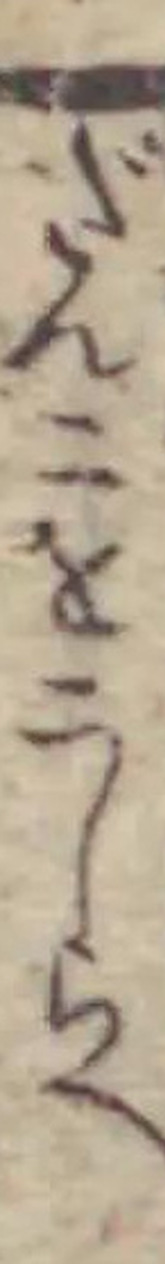だんこをこしらへ
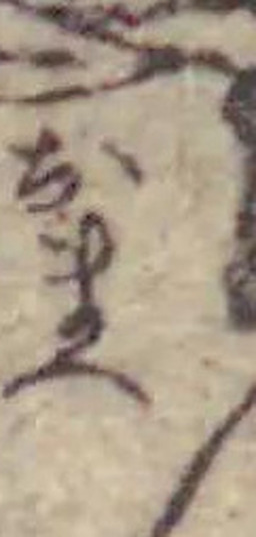おまへ
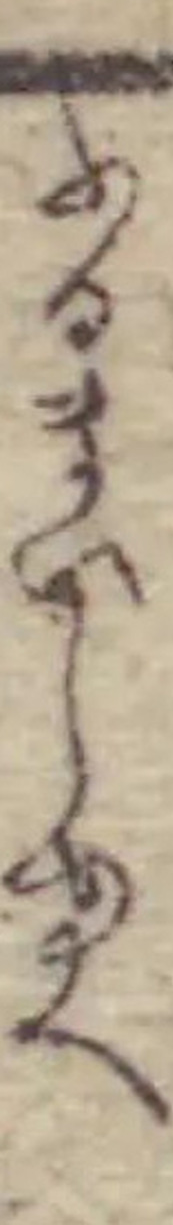ふるまいしゆへ
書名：桃太郎元服姿 2巻
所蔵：国立国会図書館 National Diet Library, JAPAN
